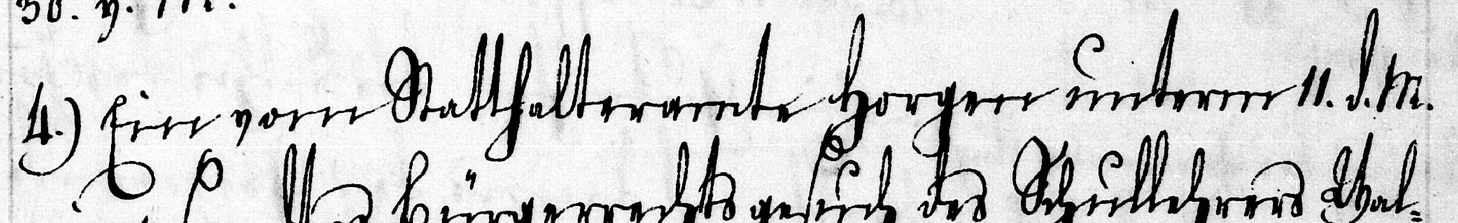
4.) Ein vom Statthalteramte Horgen unterm 11. d. M.
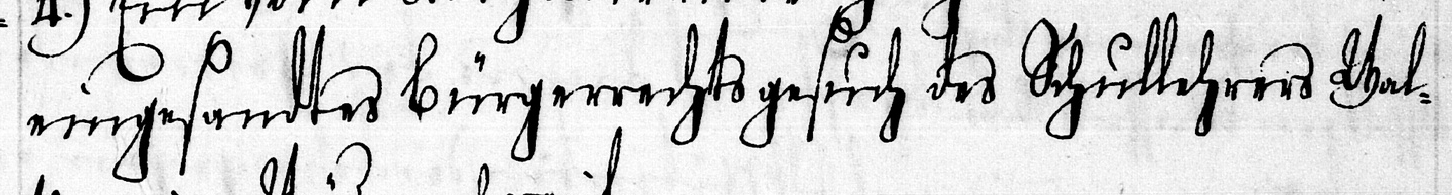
eingesandtes Bürgerrechtsgesuch des Schullehrers Wal¬
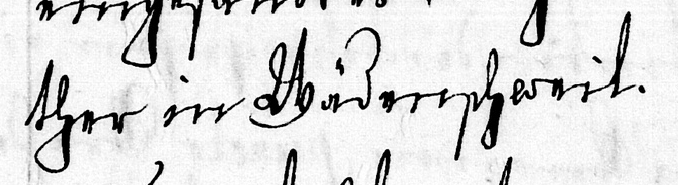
ther in Wädenschweil.
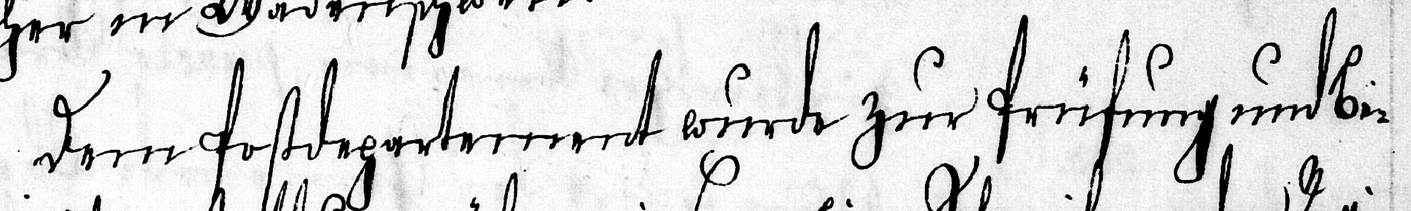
Dem Postdepartement wurde zur Prüfung und Be¬
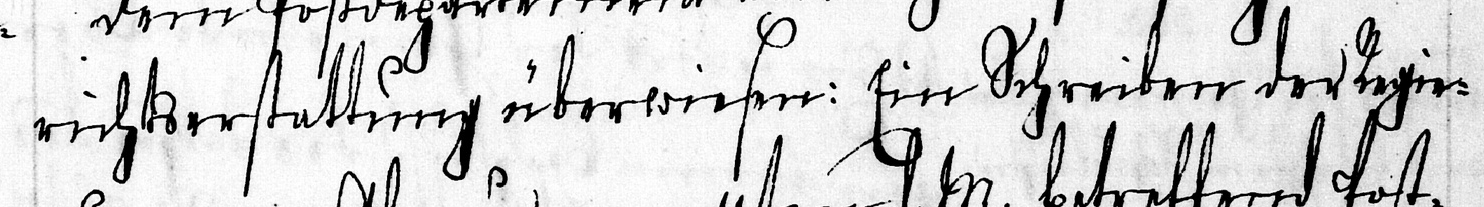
richtserstattung überwiesen: Ein Schreiben der Regie¬
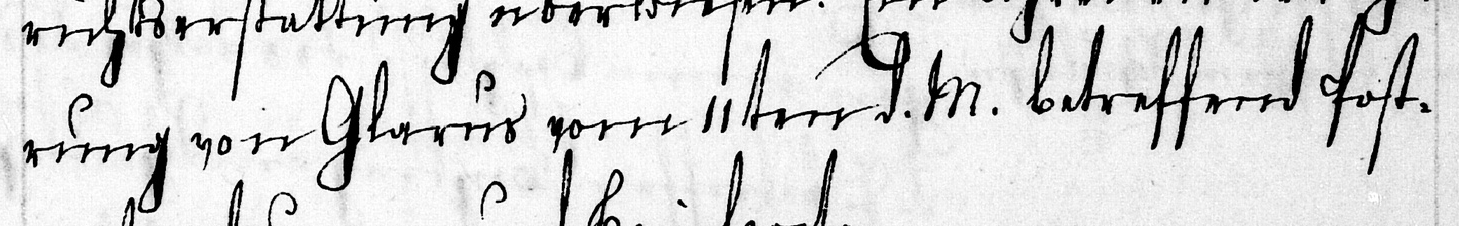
rung von Glarus vom 11ten d. M. betreffend Post¬
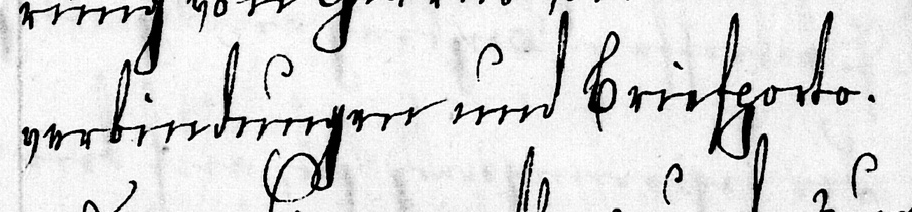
verbindungen und Briefporto.
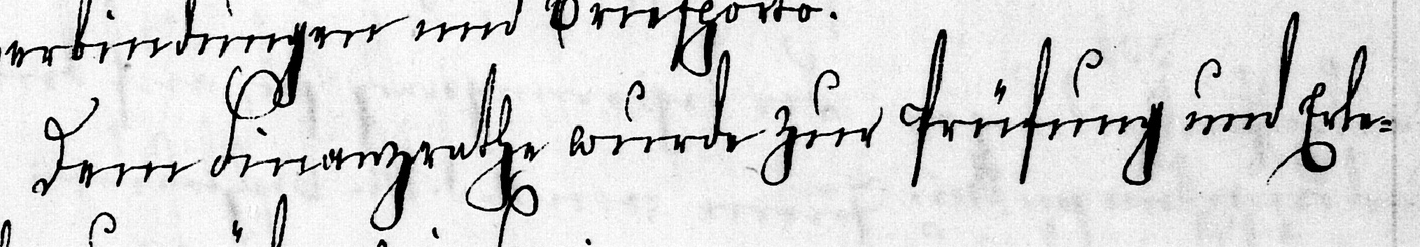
Dem Finanzrathe wurde zur Prüfung und Erle¬
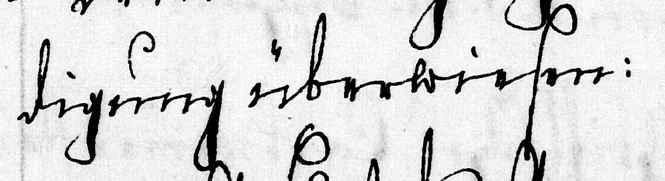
digung überwiesen:
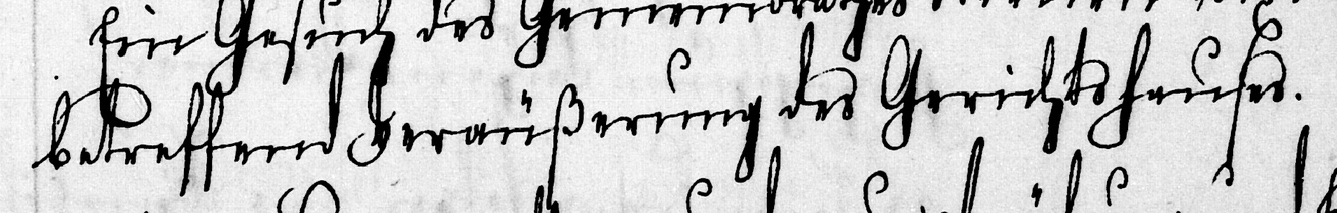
betreffend Veräußerung des Gerichtshauses.
